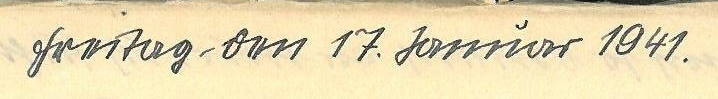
Freitag, den 17. Januar 1941.
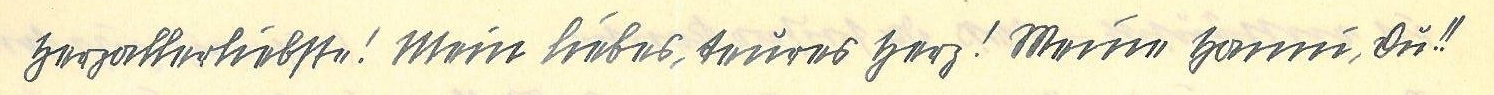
Herzallerliebste! Mein liebes, teures Herz! Meine, Du!!
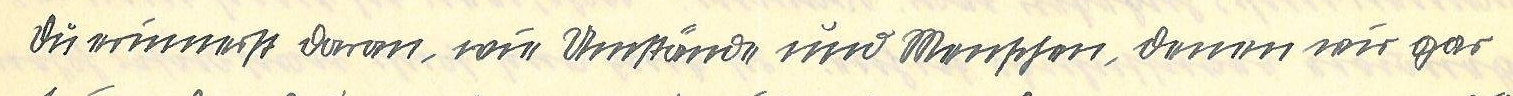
Du erinnerst daran, wie Umstände und Menschen, denen wir gar
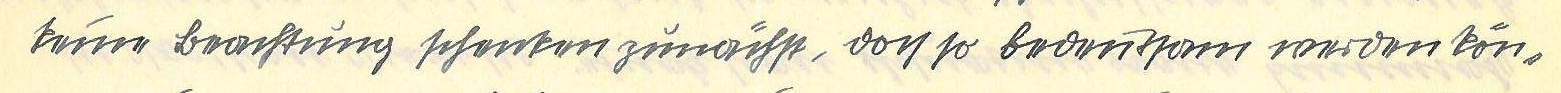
keine Bedeutung zunächst schenken, doch so bedeutsam werden kön¬
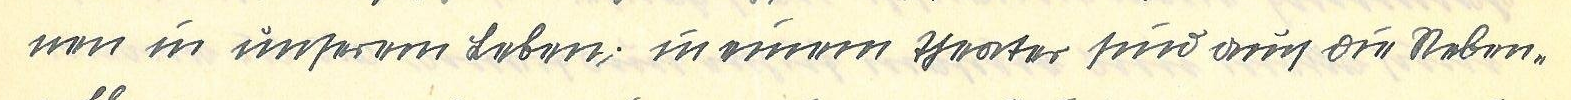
nen in unserem Leben; in einem Theater sind auch die Neben¬
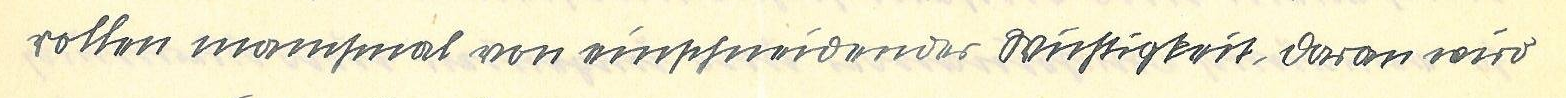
rollen manchmal von einschneidender Wichtigkeit, daran wird
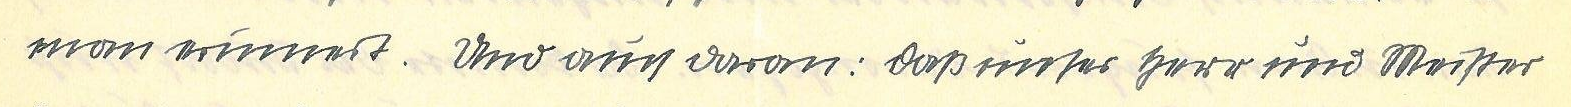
man erinnert. Und auch daran: daß unser Herr und Meister
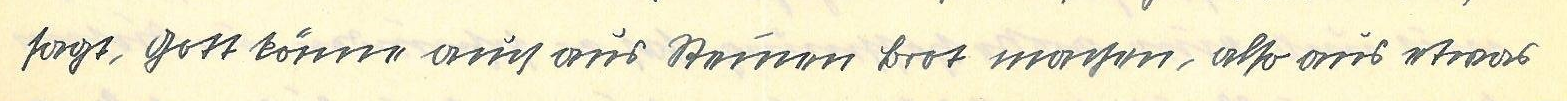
sagt, Gott könne auch aus Steinen Brot machen, also aus etwas
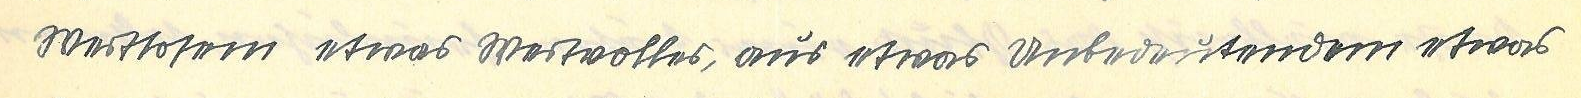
Wertlosem etwas Wertvolles, aus etwas Unbedeutendem etwas
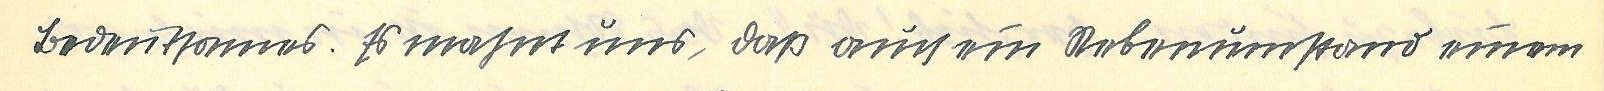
Bedeutsames. Es mahnt uns, daß auch ein Nebenumstand einem
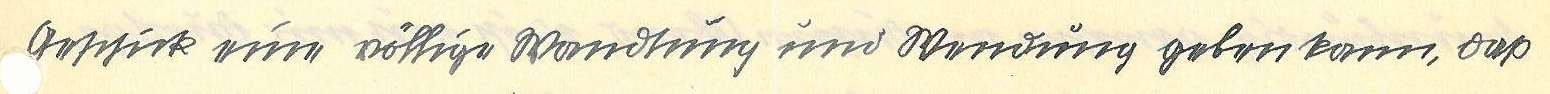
Geschick eine völlige Wandlung und Wendung geben kann, daß
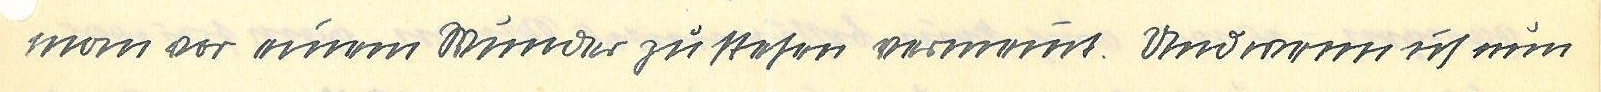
man vor einem Wunder zu stehen vermeint. Und wenn ich nun
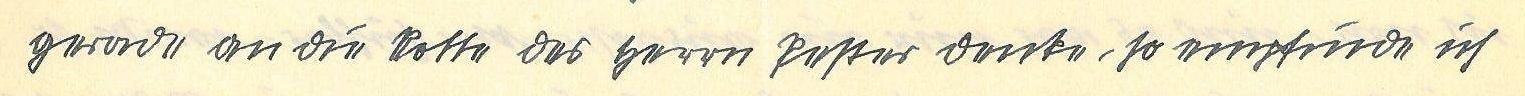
gerade an die Rolle des Herrn P. denke, so empfinde ich
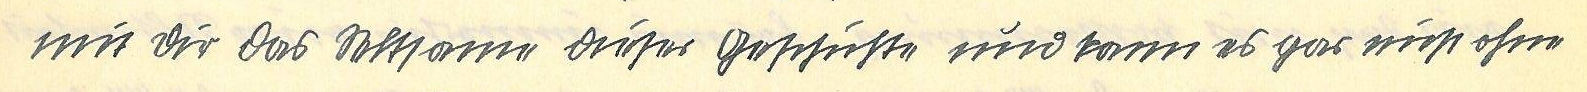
mit Dir das Seltsame dieser Geschichte und kann es gar nicht ohne
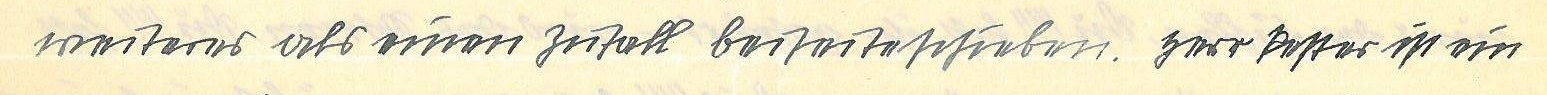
weiteres als einen Zufall beiseiteschieben. Herr P. ist ein
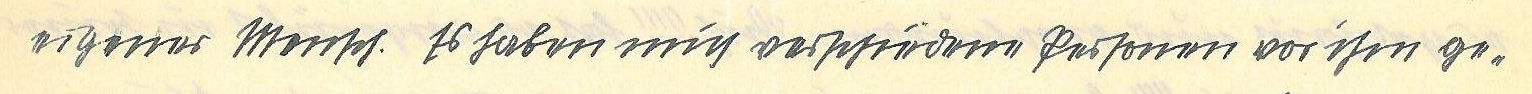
eigener Mensch. Es haben mich verschiedene Personen vor ihm ge¬
